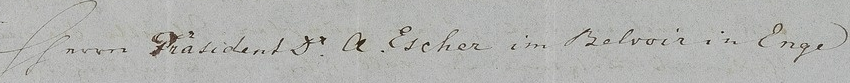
HHerrn Präsident Dr A.Escher im Belvoir in Enge.
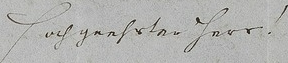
Hochgeehrter Herr!
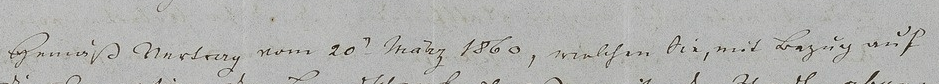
Gemäß Vertrag vom 20ten März 1860, welchen Sie, mit Bezug auf
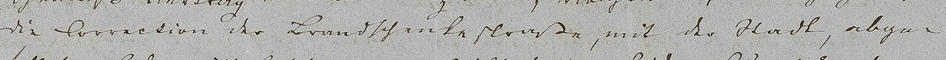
die Correction der Brandschenkestraße, mit der Stadt, abge-
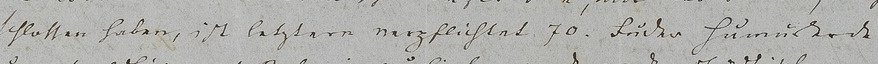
schlossen haben, ist letztere verpflichtet 70. Fuder Humuserde
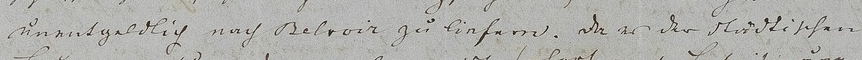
unentgeldlich nach Belvoir zu liefern. Da es der städtischen
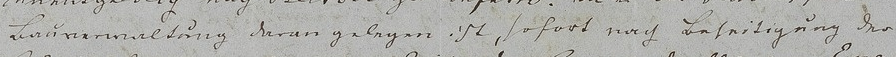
Bauverwaltung daran gelegen ist, sofort nach Beseitigung der
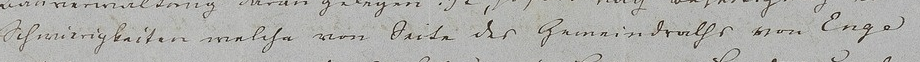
Schwierigkeiten welche von Seite des Gemeindraths von Enge
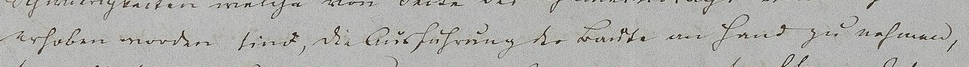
erhoben worden sind, die Ausführung der Baute an Hand zu nehmen,
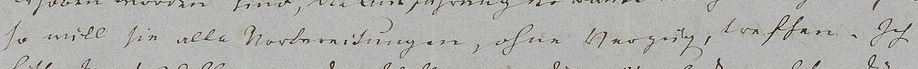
so will sie alle Vorbereitungen, ohne Verzug, treffen. Ich
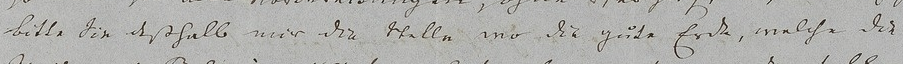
bitte Sie deßhalb mir die Stelle wo die gute Erde, welche die
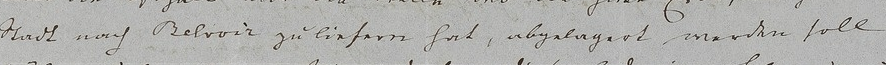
Stadt nach Belvoir zu liefern hat, abgelagert werden soll,
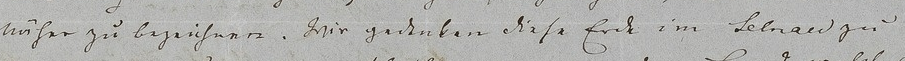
näher zu bezeichnen. Wir gedenken diese Erde im Selnau zu
